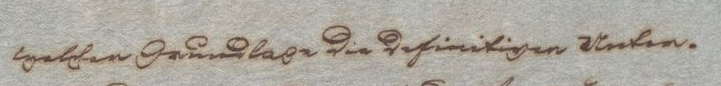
welcher Grundlage die definitiven Unter-
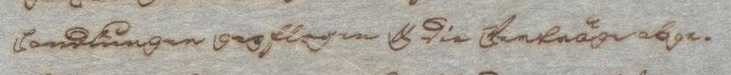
handlungen gepflogen & die Verträge abge-
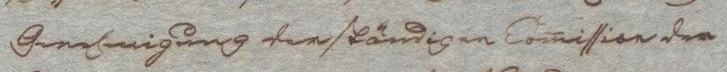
Genehmigung der ständigen Commission der
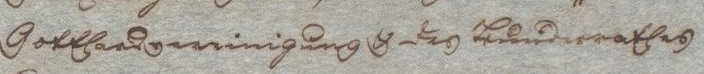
Gotthardvereinigung & des Bundesrathes
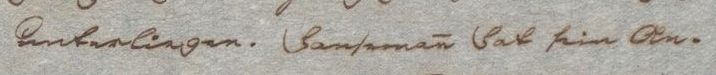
unterliegen. Hansemann hat sein An-
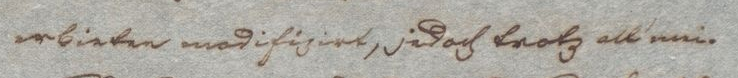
erbieten modifiziert, jedoch trotz all' mei-
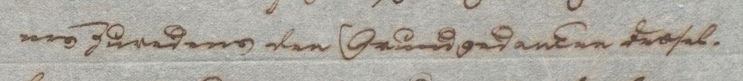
nes Zuredens den Grundgedanken dessel-
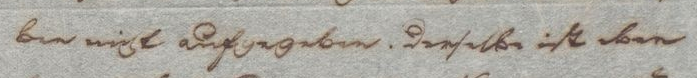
ben nicht aufgegeben. Derselbe ist eben
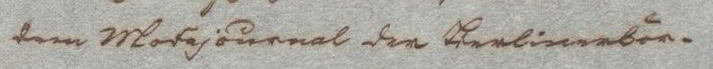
dem Modejournal der Berlinerbör-
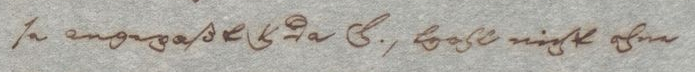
se angepaßt & da H., wohl nicht ohne
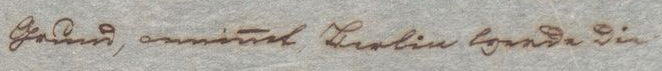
Grund, annimmt, Berlin werde die
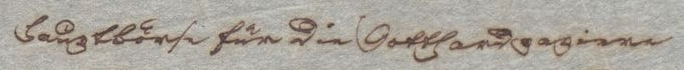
Hauptbörse für die Gotthardpapiere
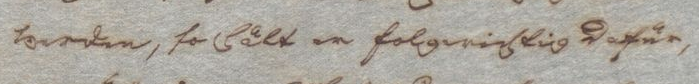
werden, so hält er folgerichtig dafür,
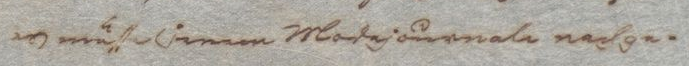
es müsse jenem Modejournale nachge-
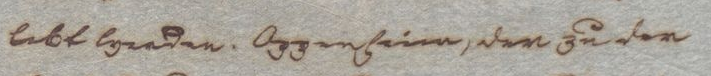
lebt werden. Oppenheimer, der zu der
